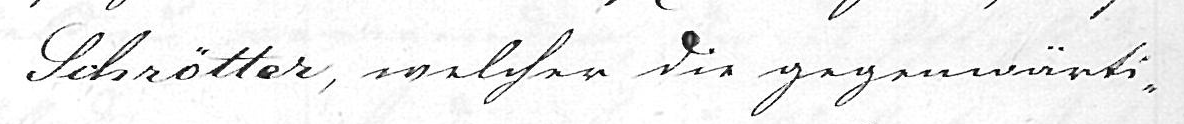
Schrötter, welcher die gegenwärti-
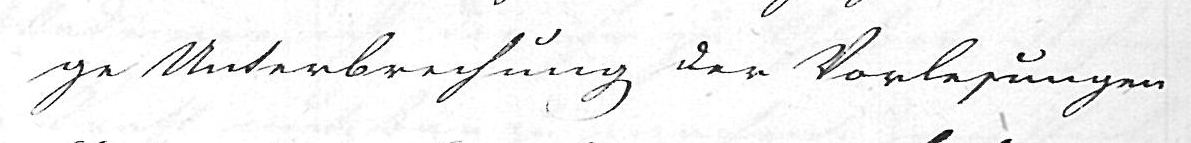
ge Unterbrechung der Vorlesungen
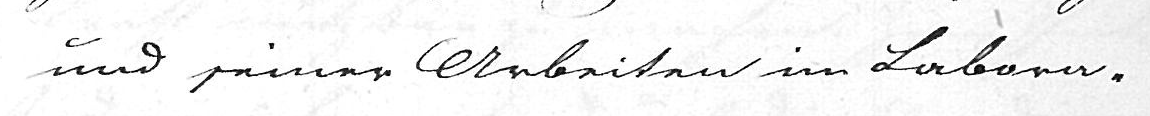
und seiner Arbeiten im Labora-
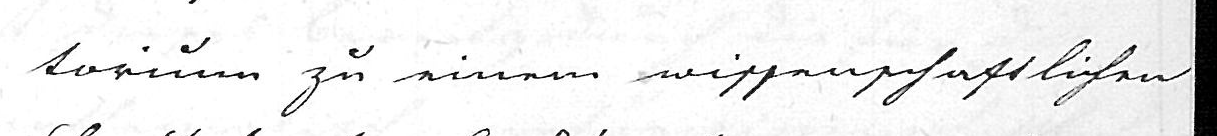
torium zu einem wissenschaftlichen
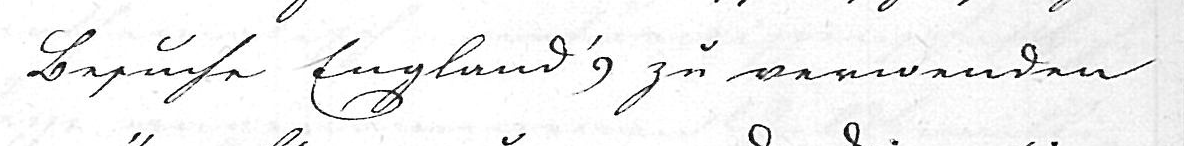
Besuchte England's zu verwenden
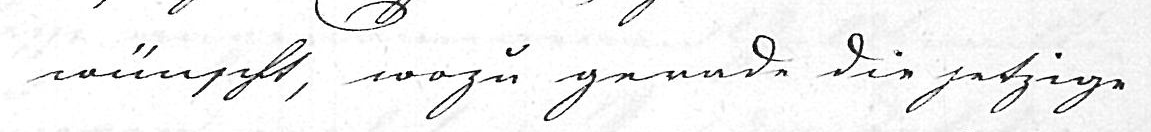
wünscht, wozu gerade die jetzige
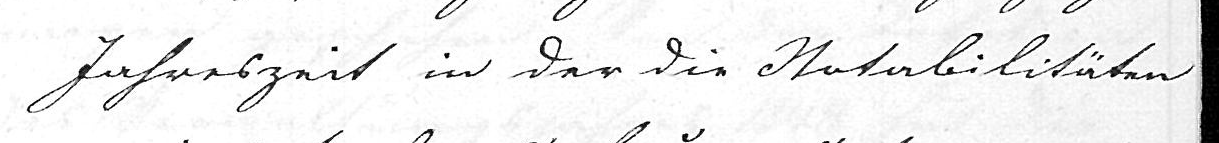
Jahreszeit in der die Notabilitäten
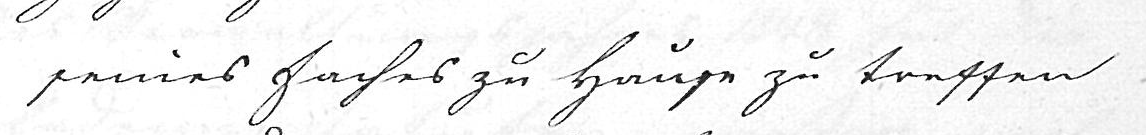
seines Faches zu Hause zu treffen
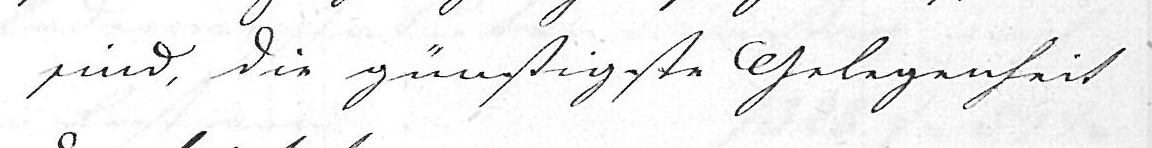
sind, die günstigste Gelegenheit
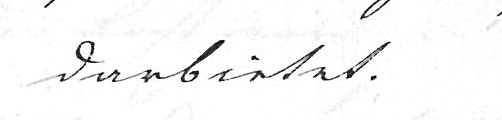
darbietet.
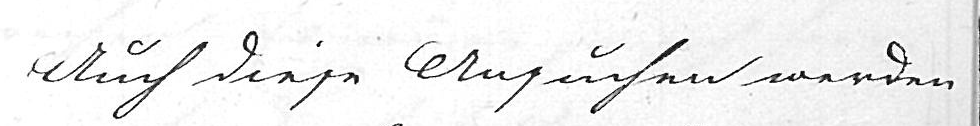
Auch diese Ansuchen werden
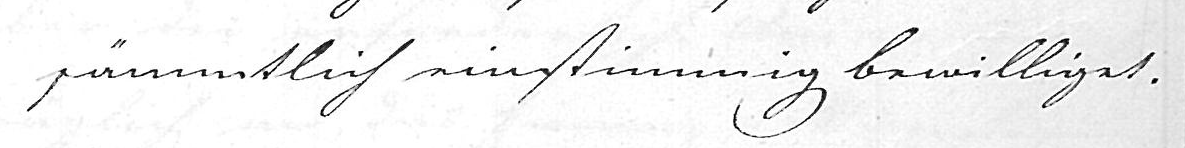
sämmtlich einstimmig bewilliget.
